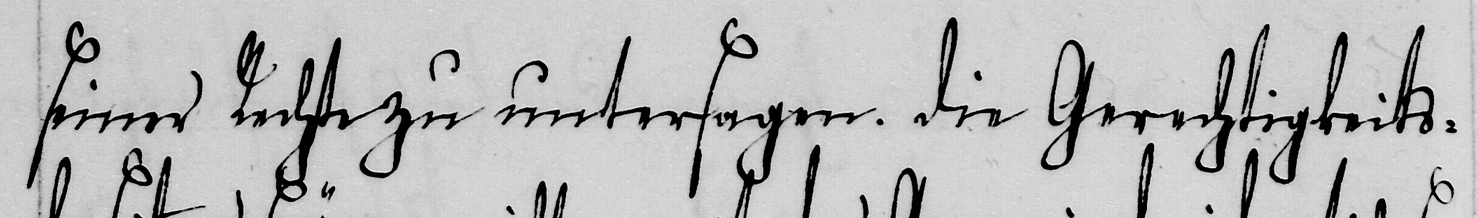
seiner Rechte zu untersagen. die Gerechtigkeits¬
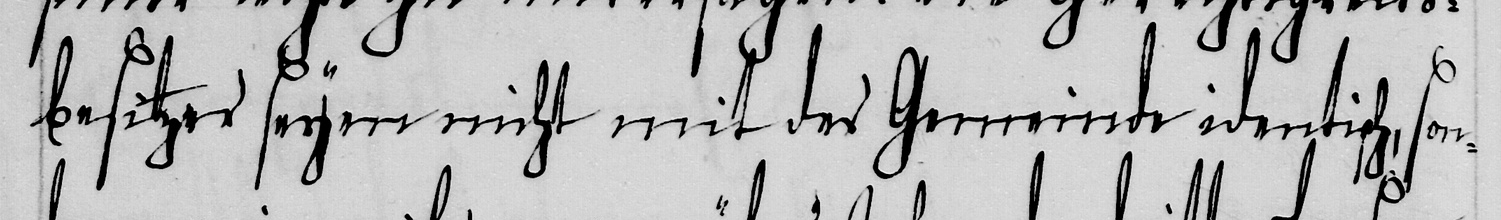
besitzer seyen nicht mit der Gemeinde identisch, s¬
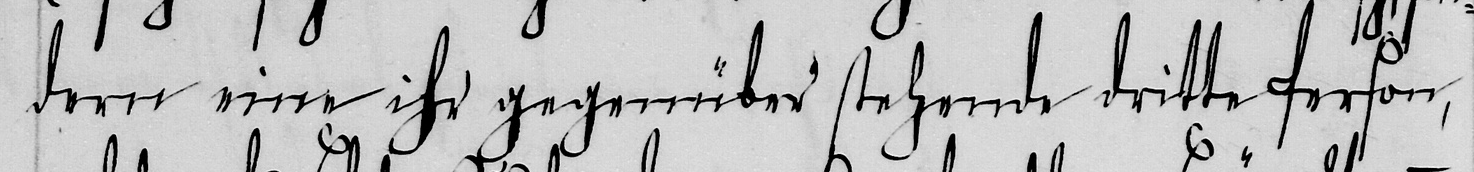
dern eine ihr gegenüber stehende dritte Person,
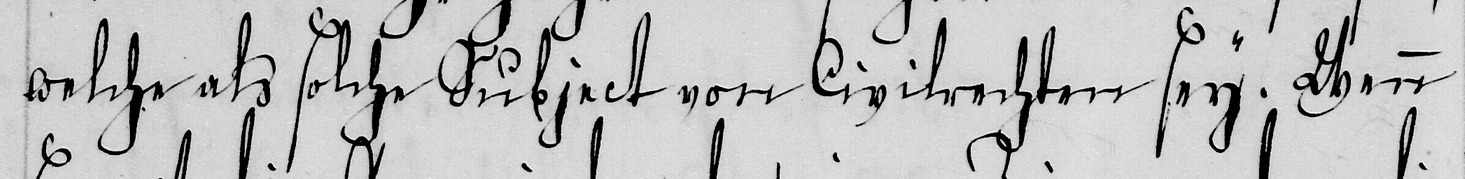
welche als solche Subject von Civilrechten sey. Wenn
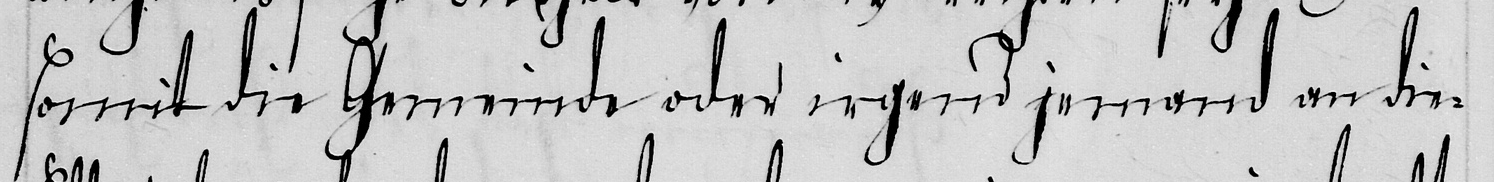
somit die Gemeinde oder irgend jemand an die¬
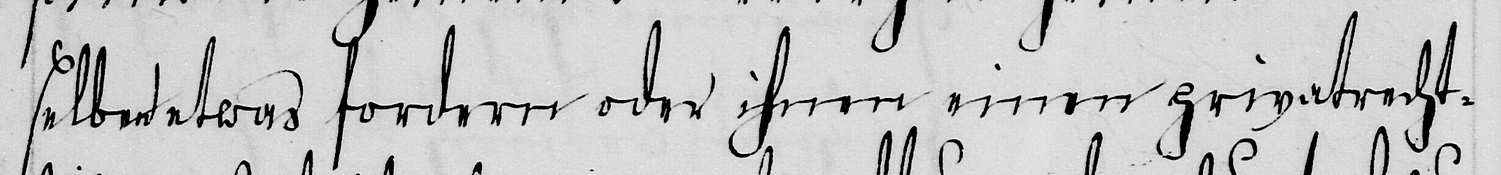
selbe etwas fordern oder ihnen einen privatrecht¬
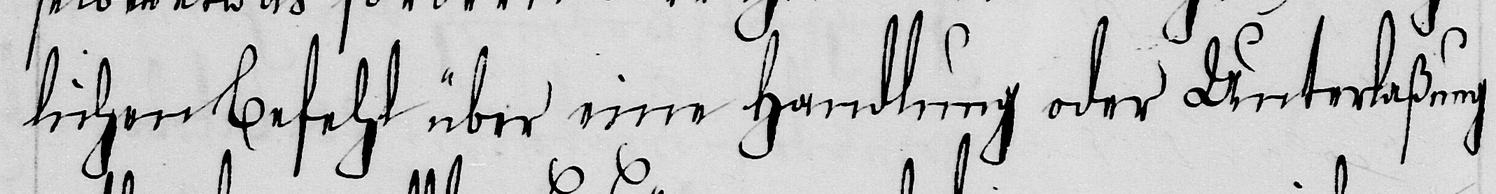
lichen Befehl über eine Handlung oder Unterlaßung
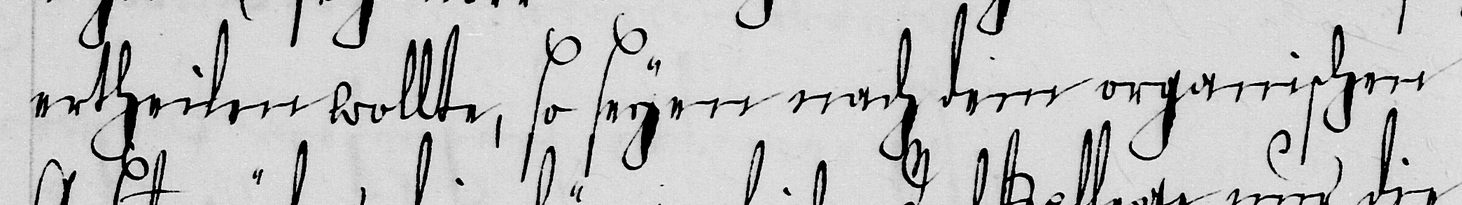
ertheilen wollte, so seyen nach dem organischen
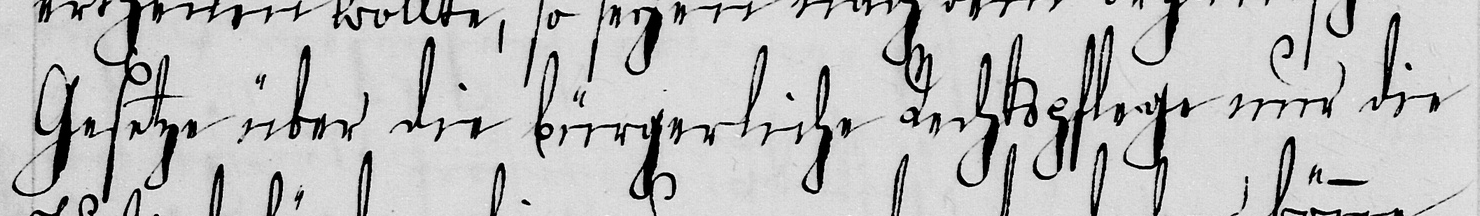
Gesetze über die bürgerliche Rechtspflege nur die
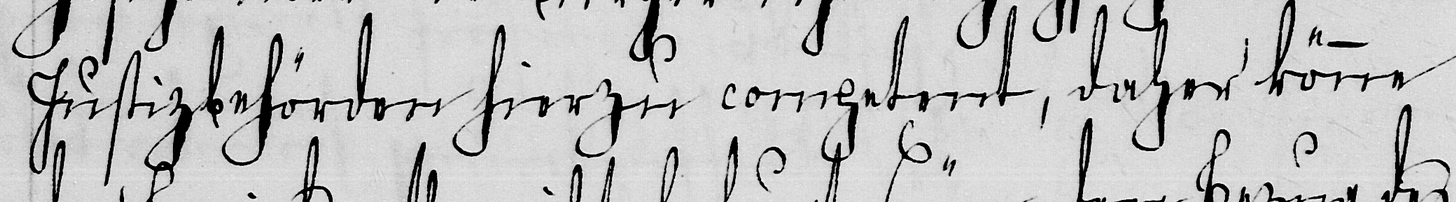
Justozbehörden hierzu competent, daher könne
